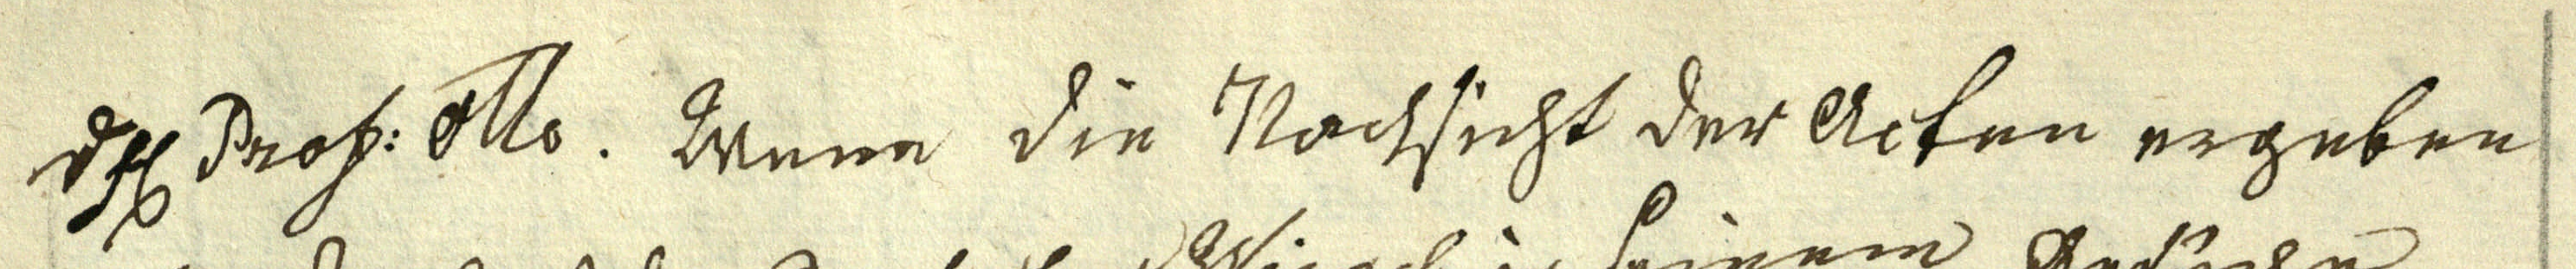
dh Prof. Otto. Wenn die Nachsicht der Acten ergeben
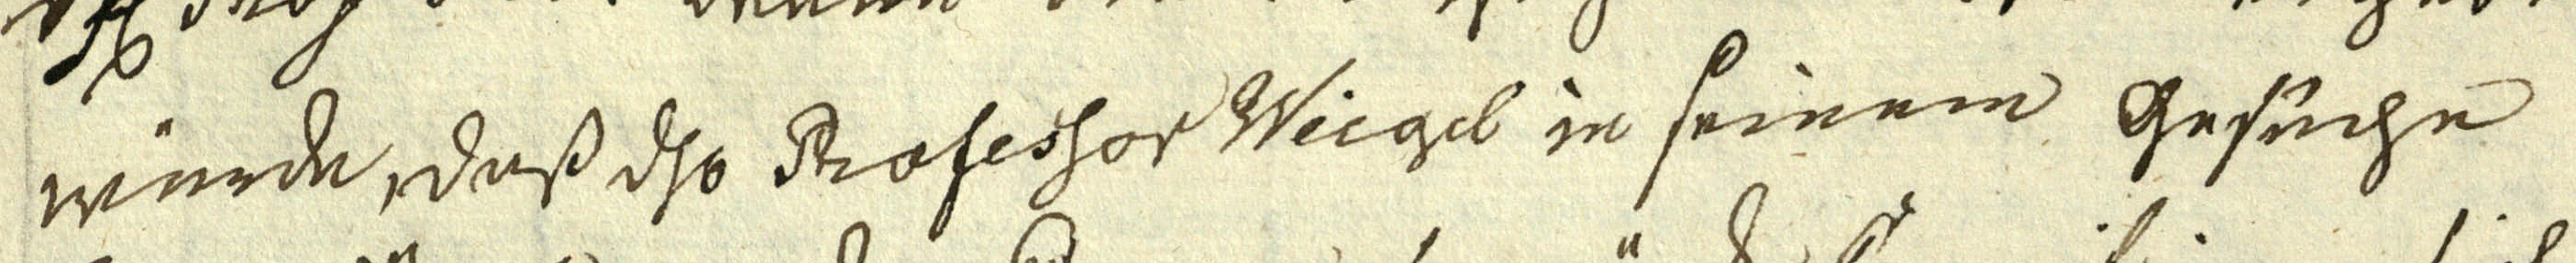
würde, daß dh Professor Weigel in seinem Gesuche
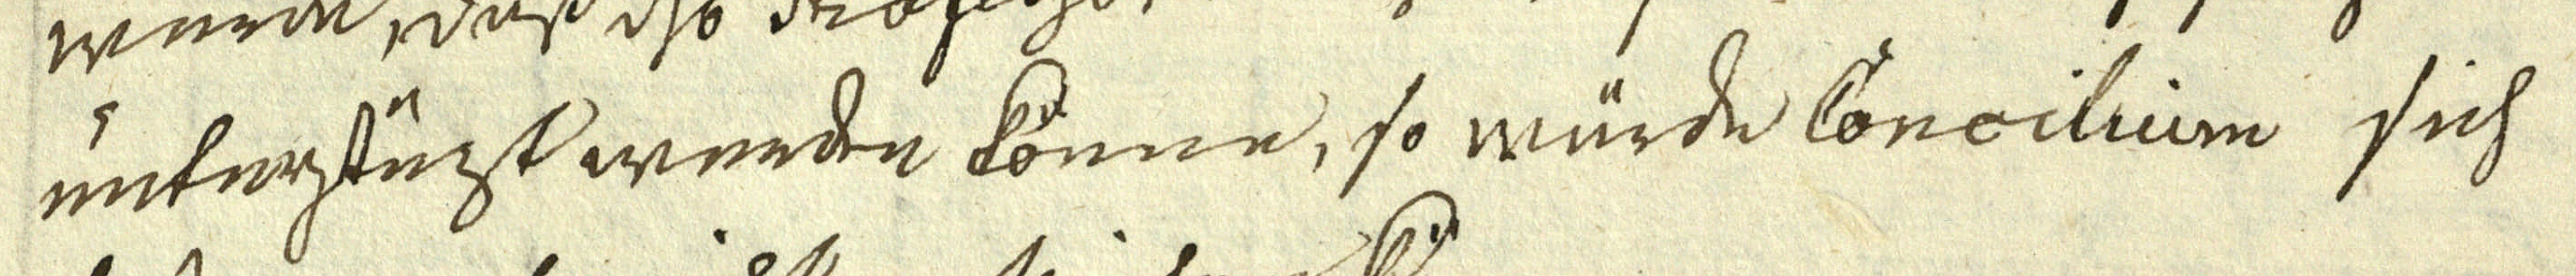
unterstüzt werden könne, so würde Concilium sich
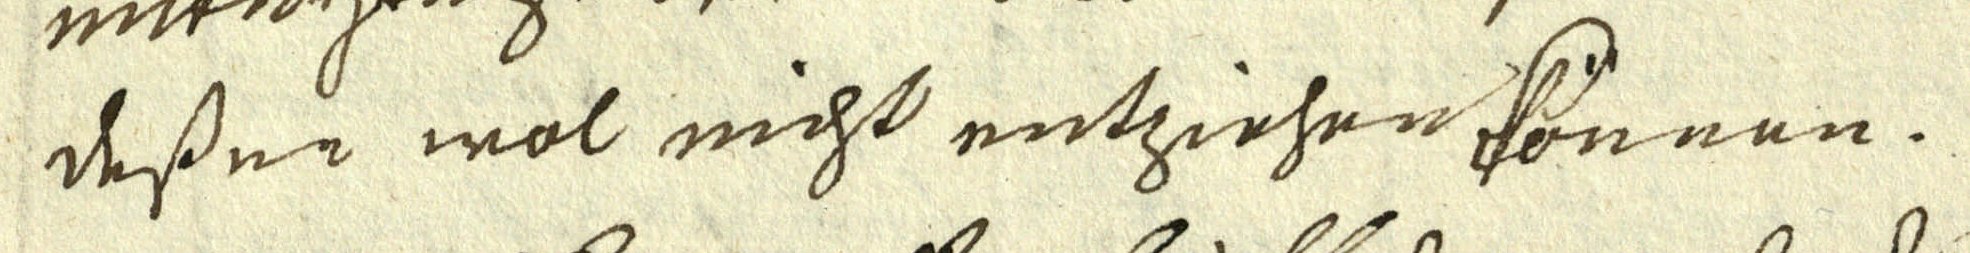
deßen wol nicht entziehen können.
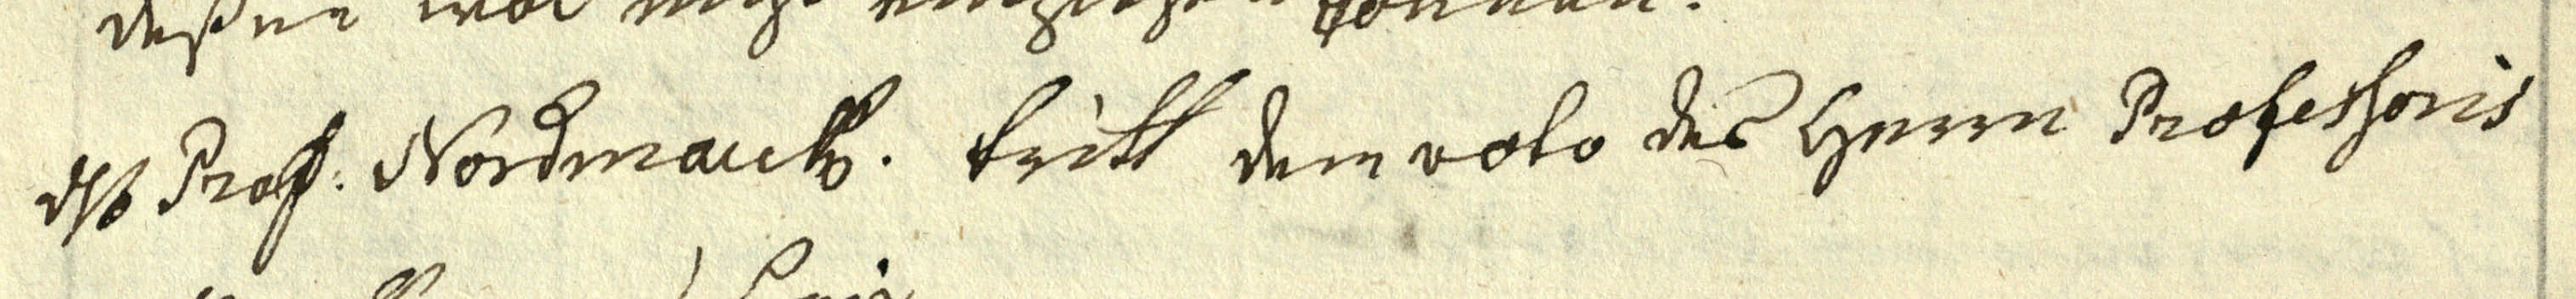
dh. Prof. Nordmarck. tritt dem voto des Herrn Professoris
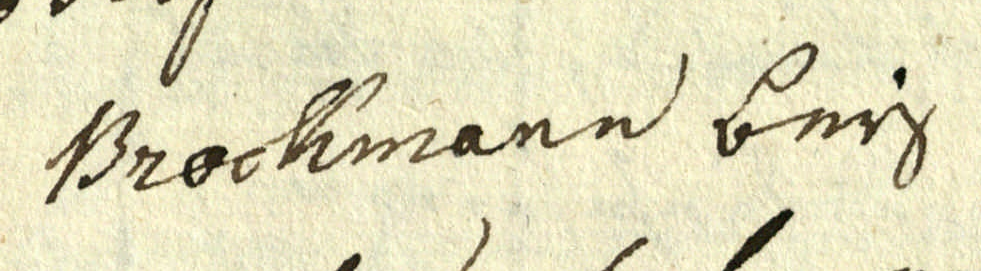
Brockmann beÿ
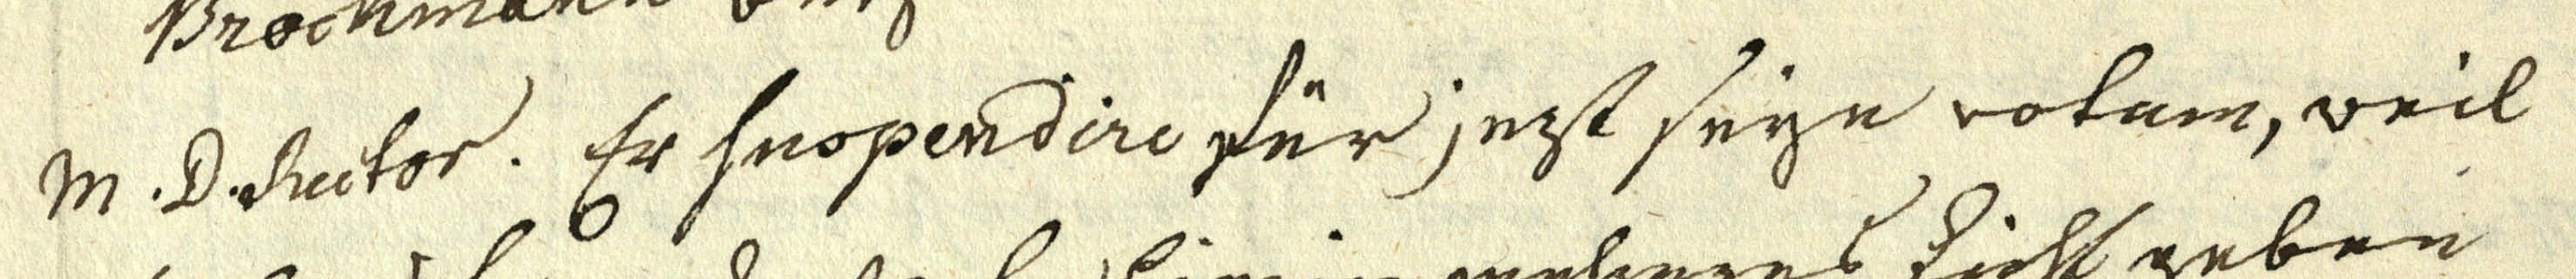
M. D. Rector. Er suspendire für jezt seÿn votum, weil
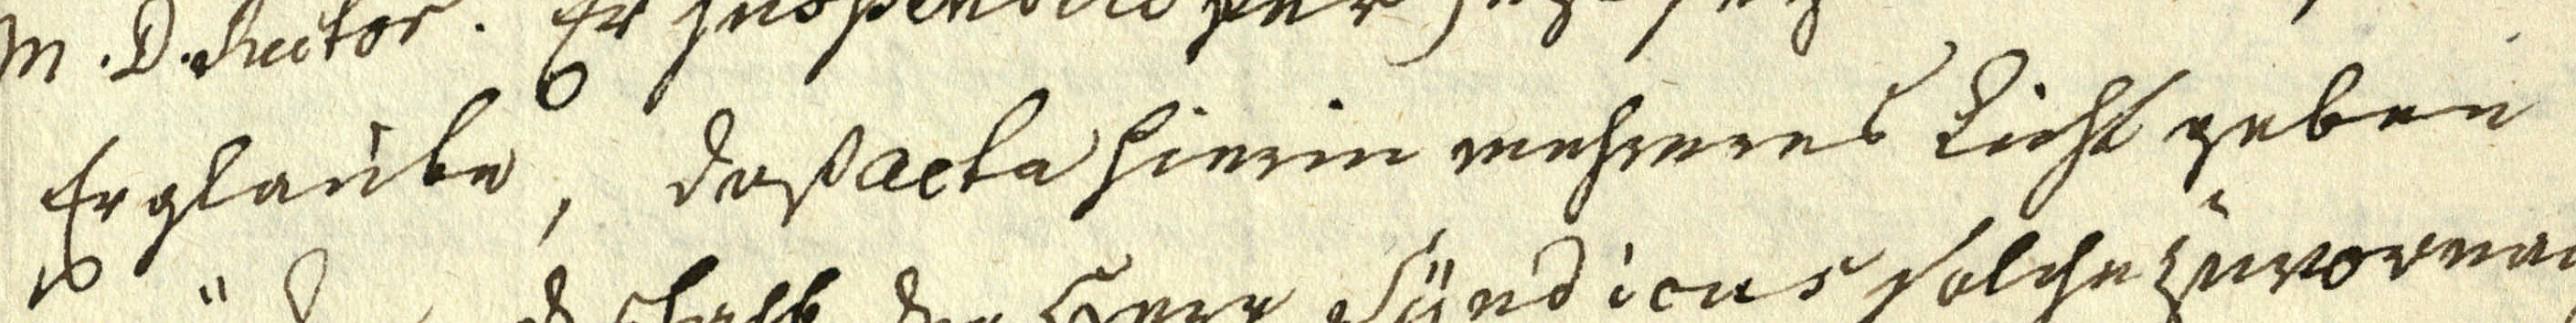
Er glaube, daß Acta hierin mehreres Licht geben
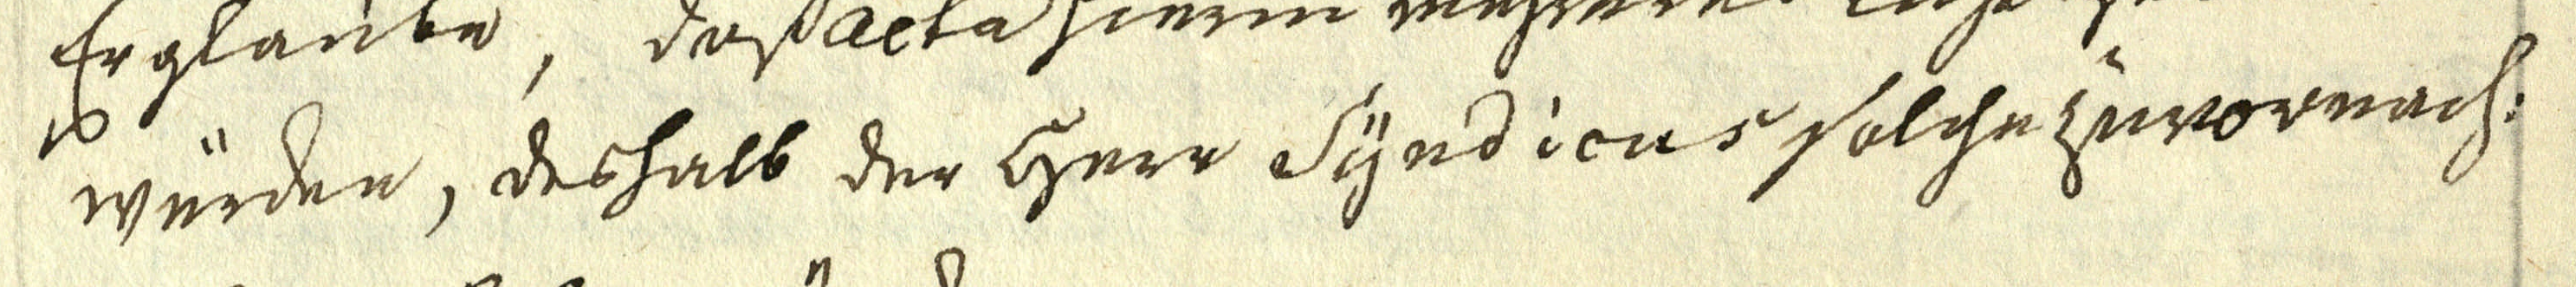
würden, deshalb der Herr Sÿndicus solche zuvor nach¬
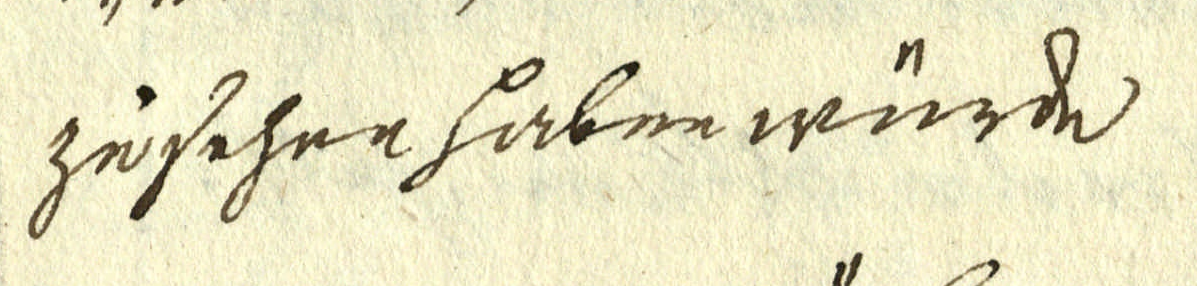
zusehen haben würde.
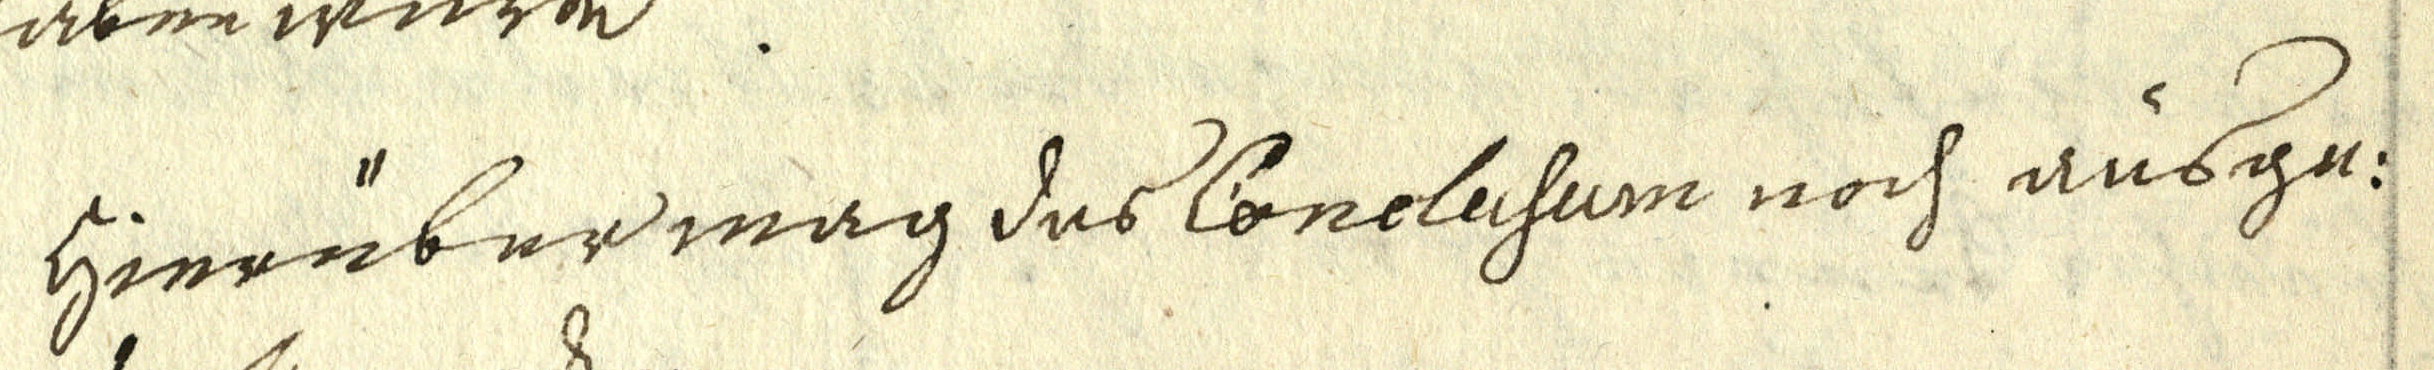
Hierüber mag das Conclusum noch ausge¬
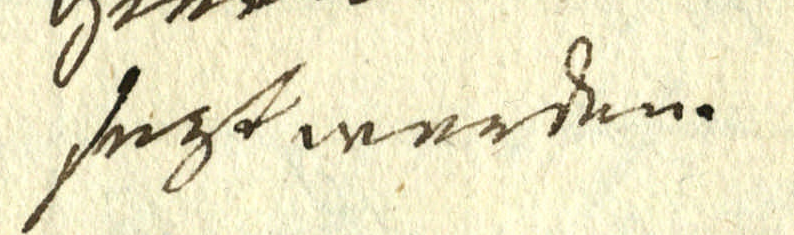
sezt werden.
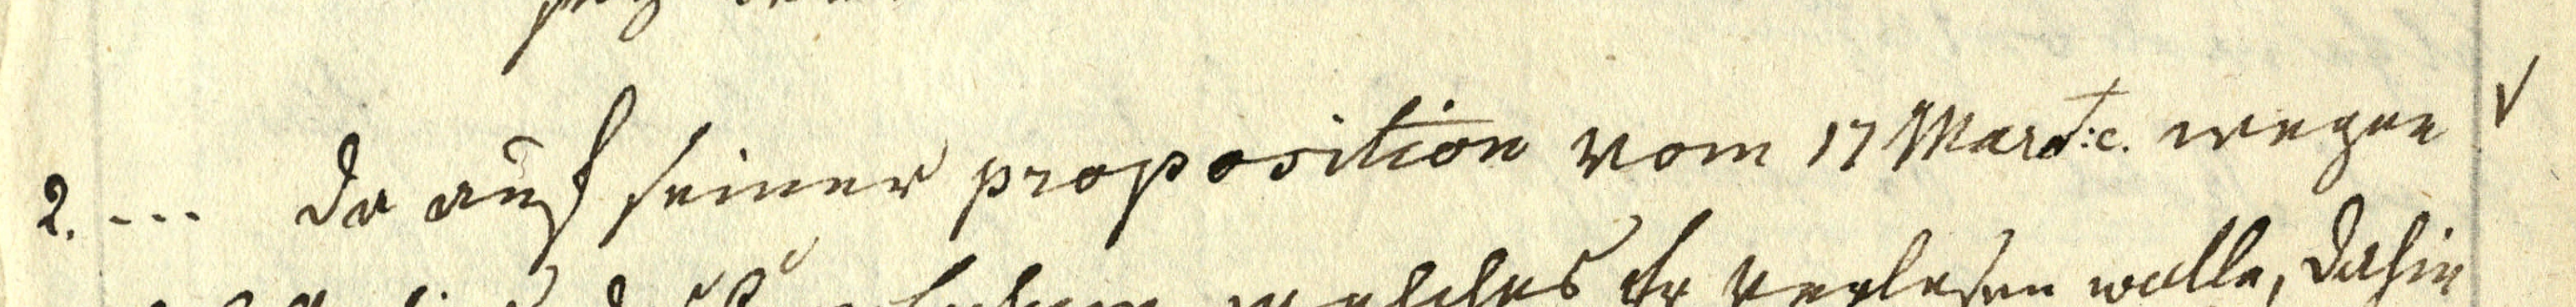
2. Da auf seiner proposition vom 17 Mart. c. wegen
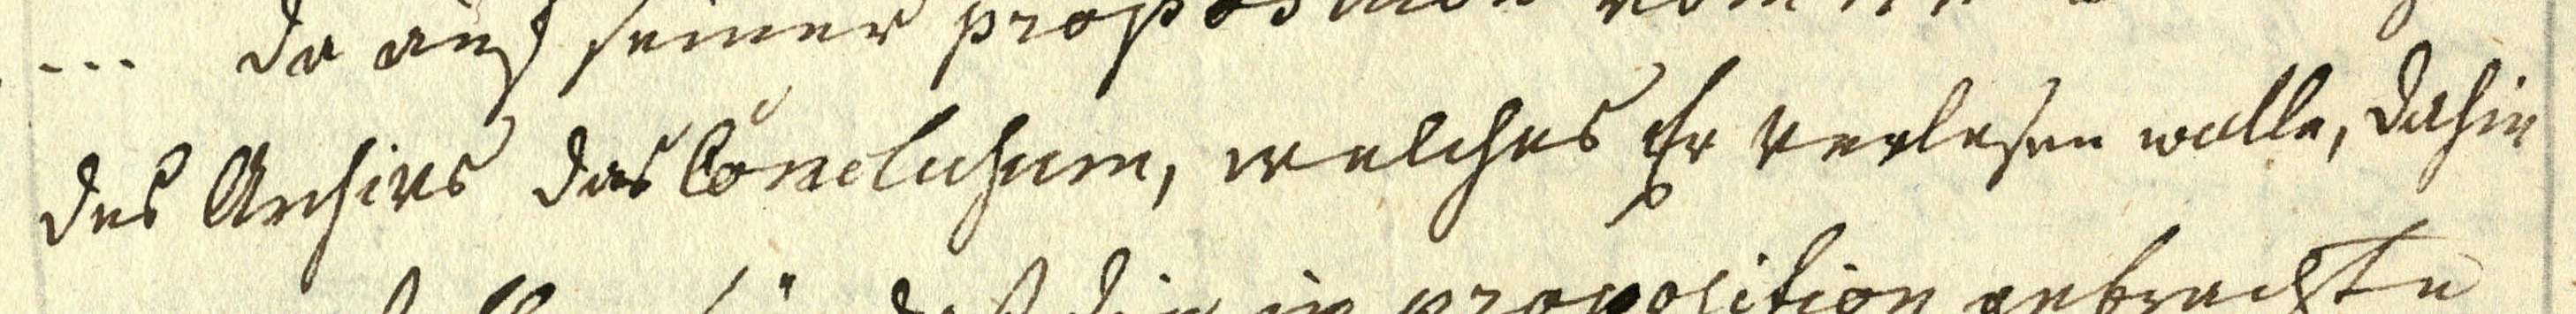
des Archivs das Conclusum, welches Er verlesen wolle, dahin
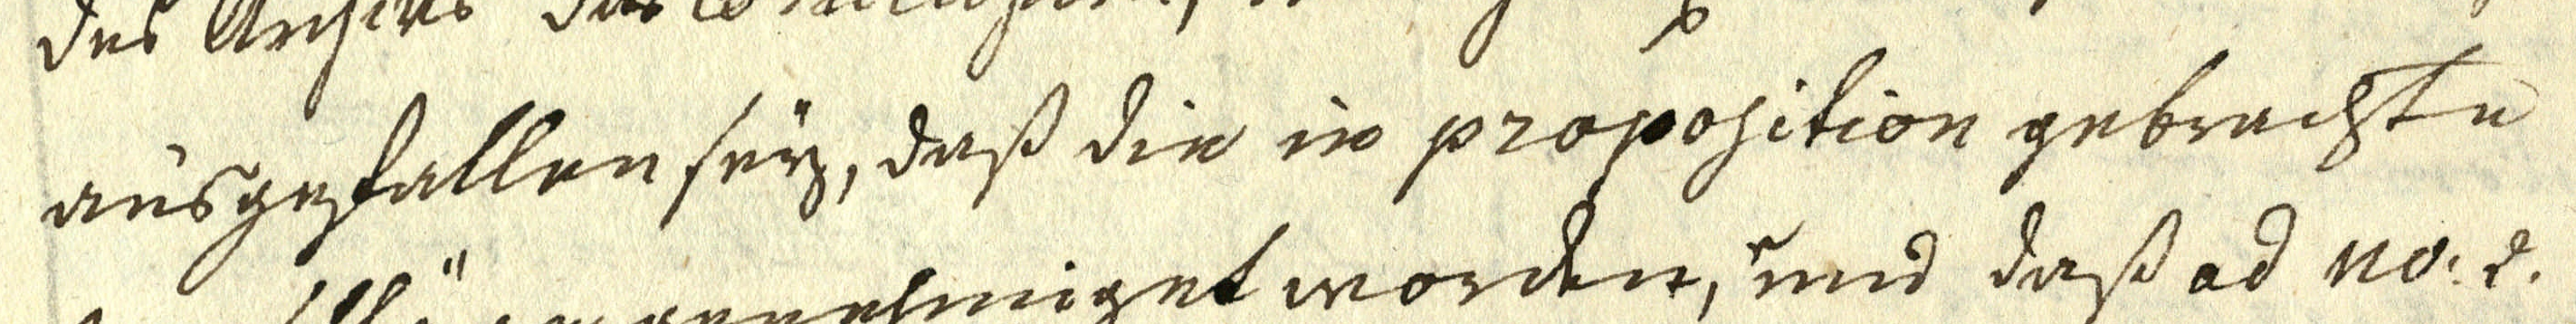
ausgefallen seÿ, daß die in proposition gebrachte
